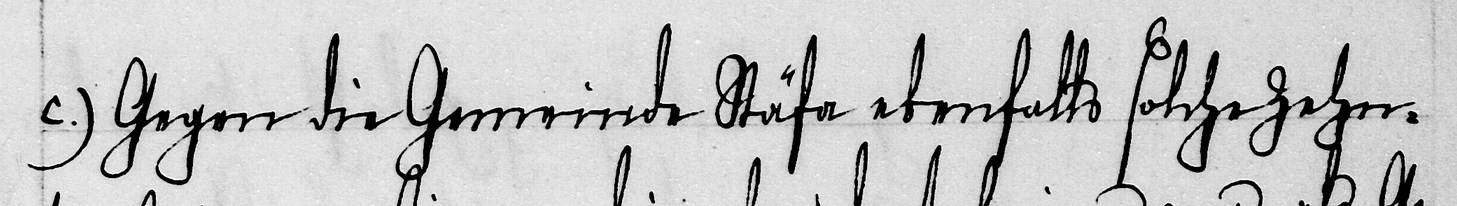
c.) Gegen die Gemeinde Stäfa ebenfalls solche Zehn¬
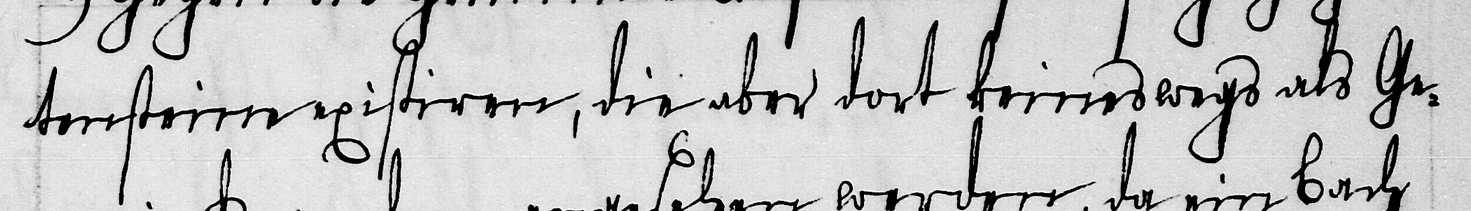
tensteine existiren, die aber dort keineswegs als Ge¬
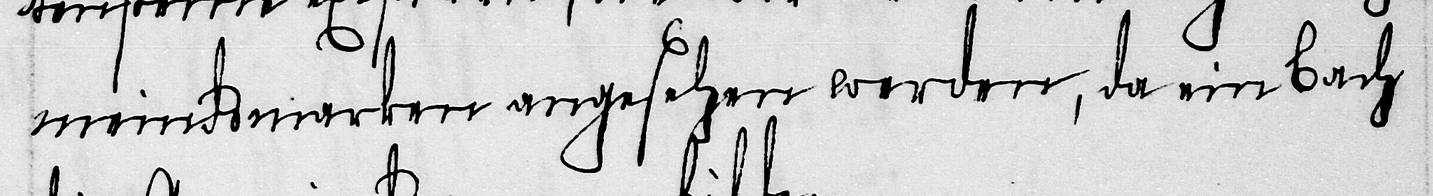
meindsmarken angesehen werden, da ein Bach
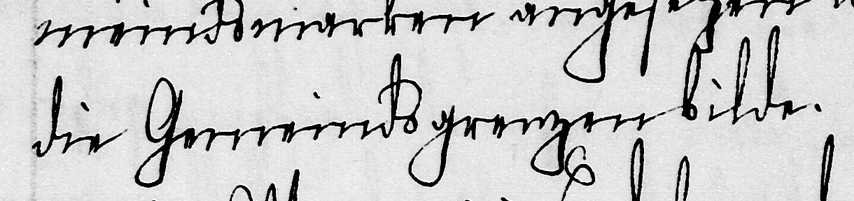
die Gemeindsgrenzen bilde.
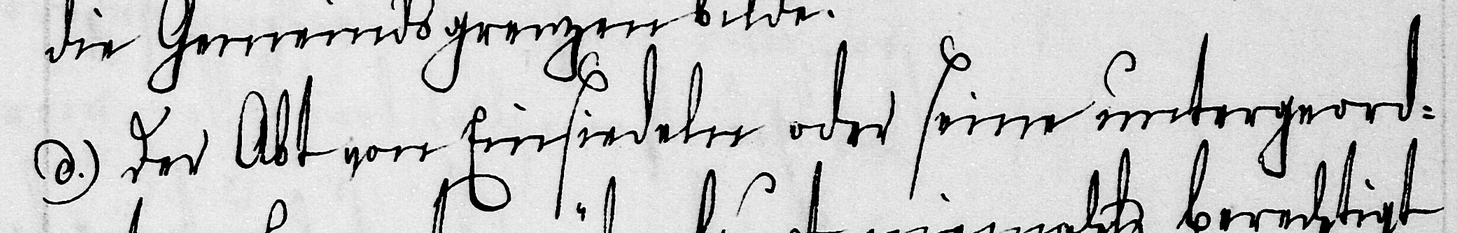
d.) Der Abt von Einsiedeln oder seine untergeord¬
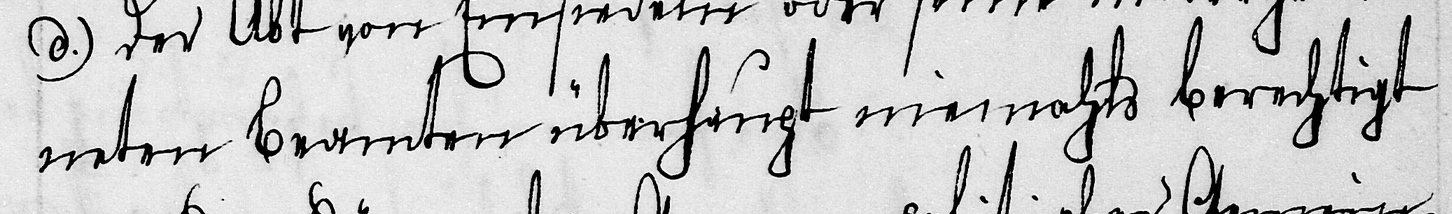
neten Beamten überhaupt niemahls berechtigt
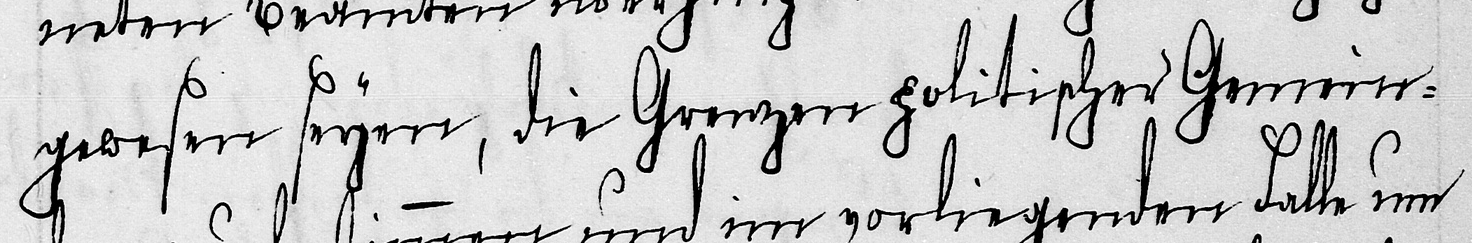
gewesen seyen, die Grenzen politischer Gemein¬
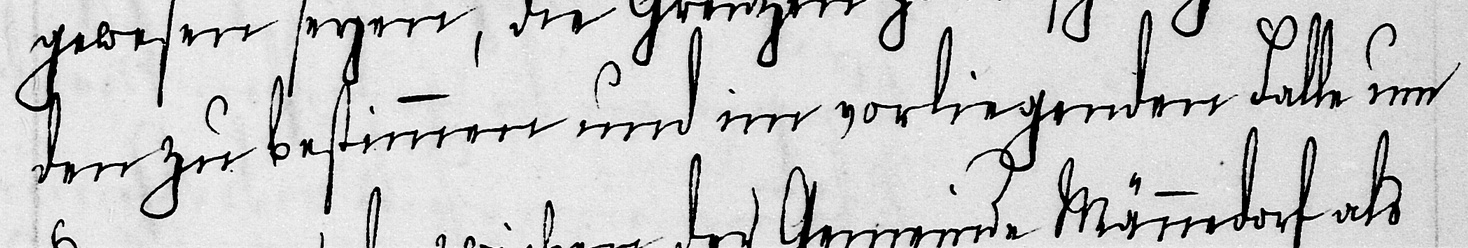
den zu bestimmen und im vorliegenden Falle um
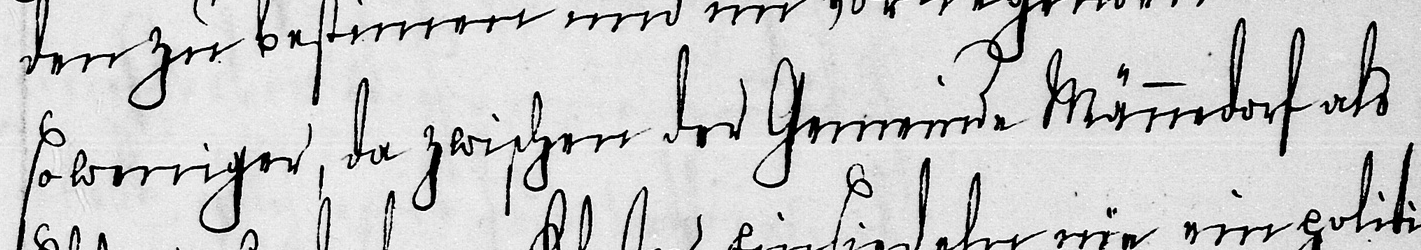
so weniger, da zwischen der Gemeinde Männedorf als
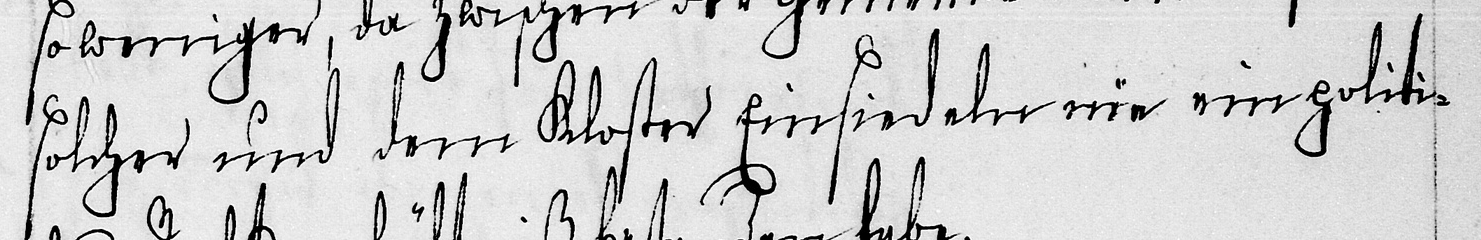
solcher und dem Kloster Einsiedeln nie ein politi¬
